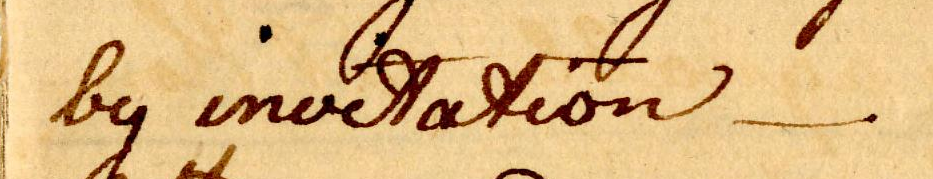by invitation
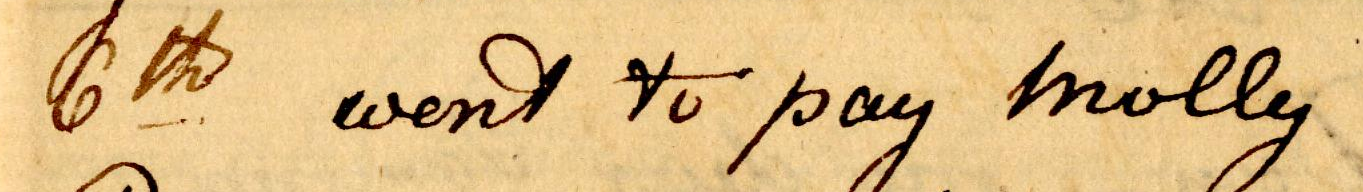6^th went to pay Molly
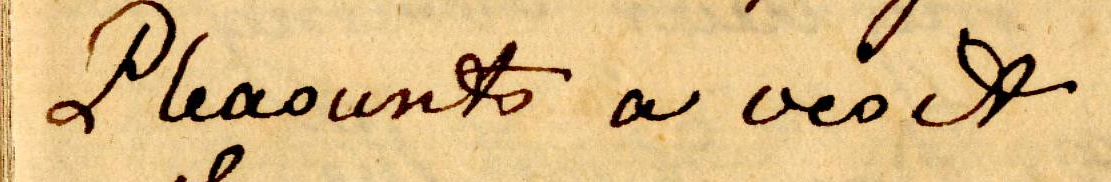Pleasants a visit
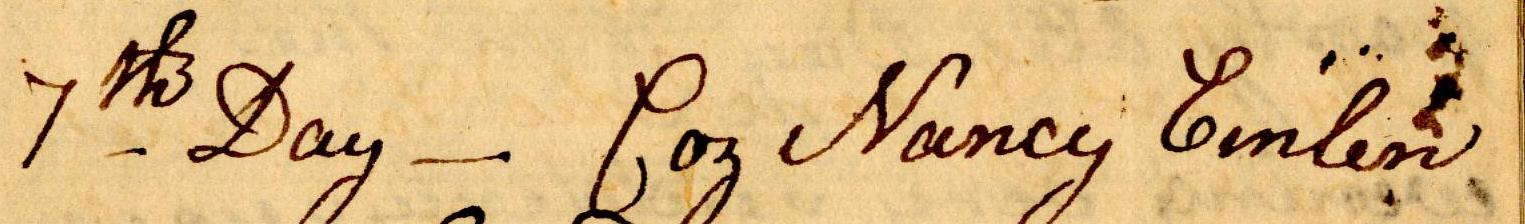7^th Day- Coz Nancy Emlen
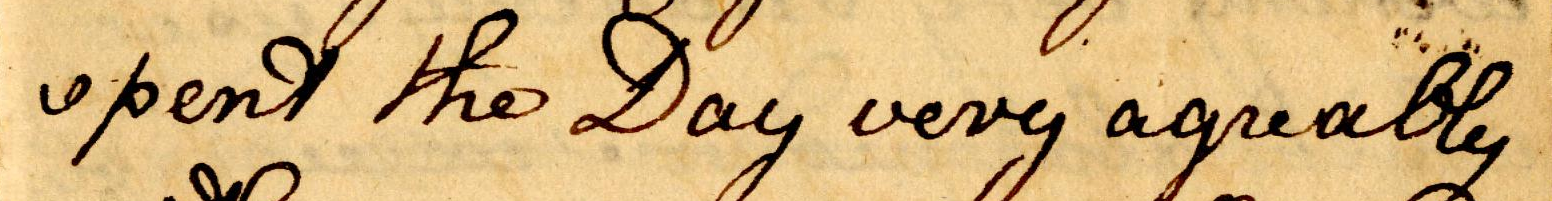spent the Day very agreably
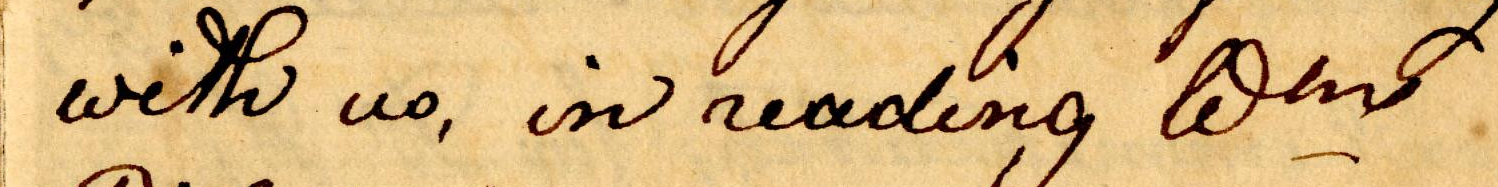with us, in reading W^m
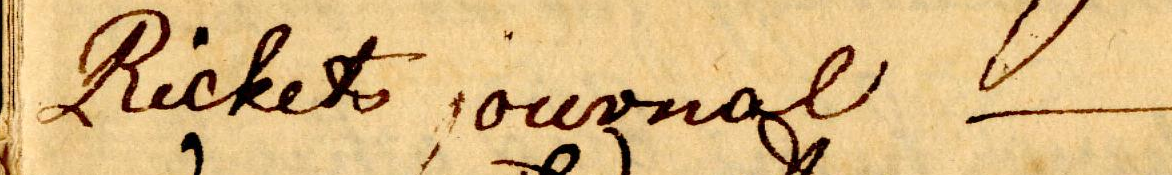Rickets journal-
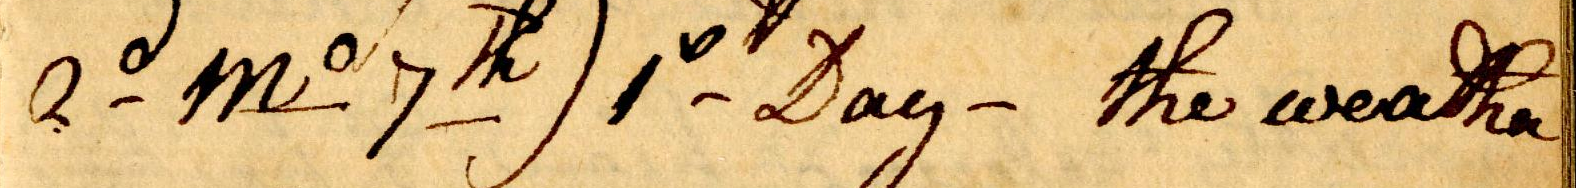2^d M^o 7^th) 1^st Day- the weather
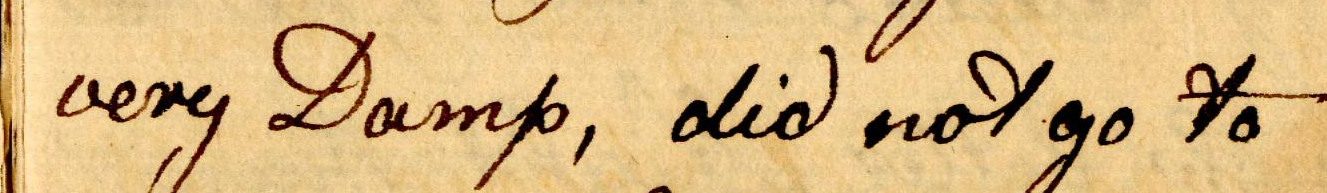very Damp, did not go to
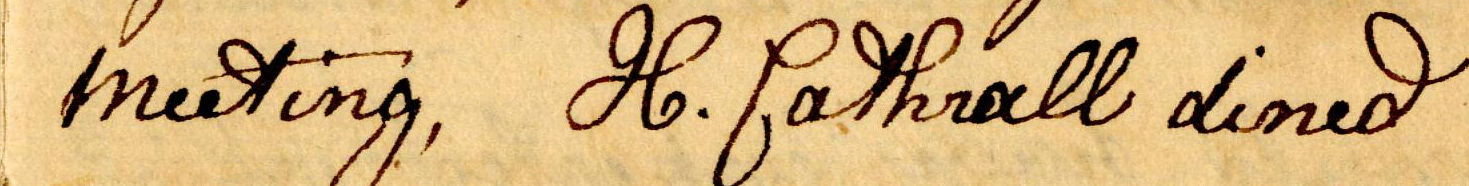Meeting, H. Cathrall dined
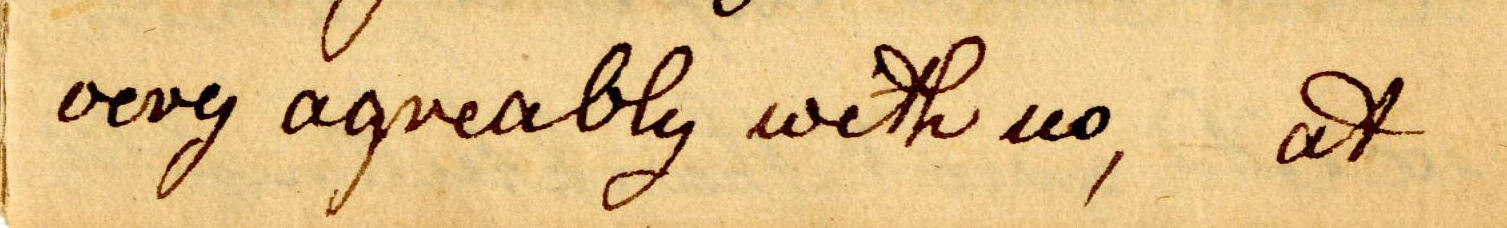very agreably with us, at
